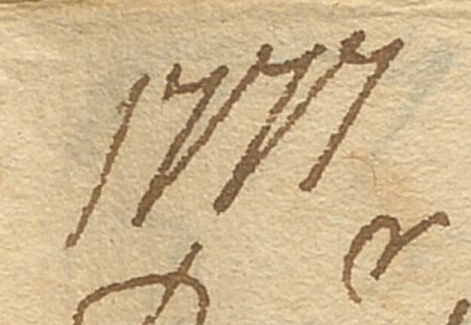1777
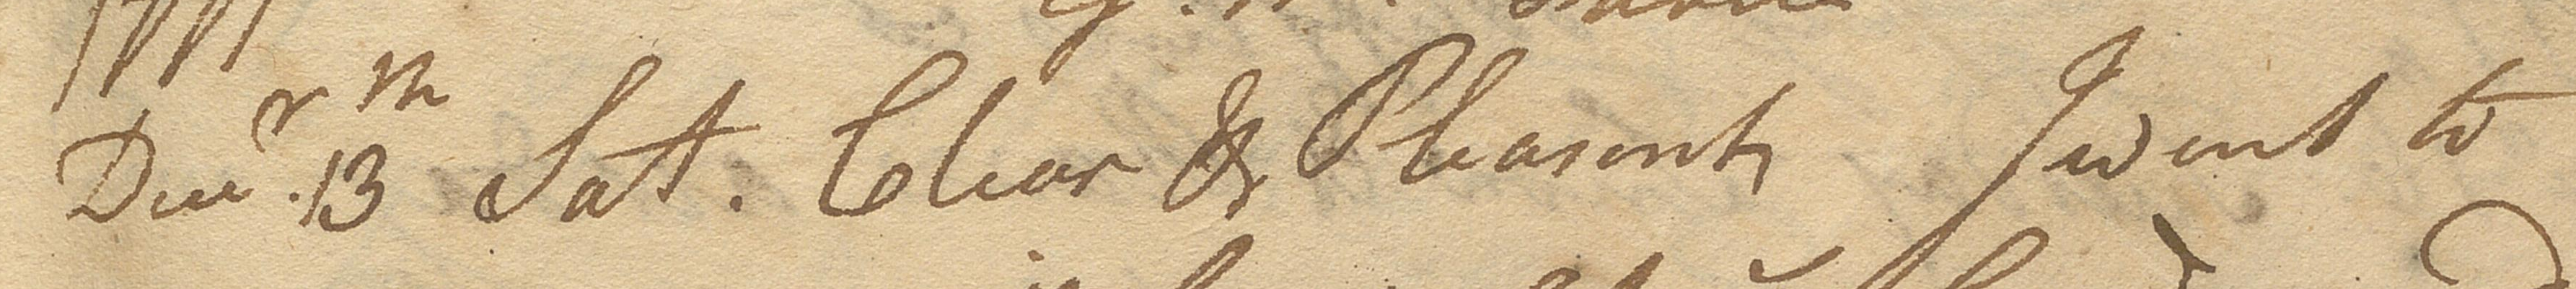Dece^r. 13^th Sat. Clear & Pleasent I went to
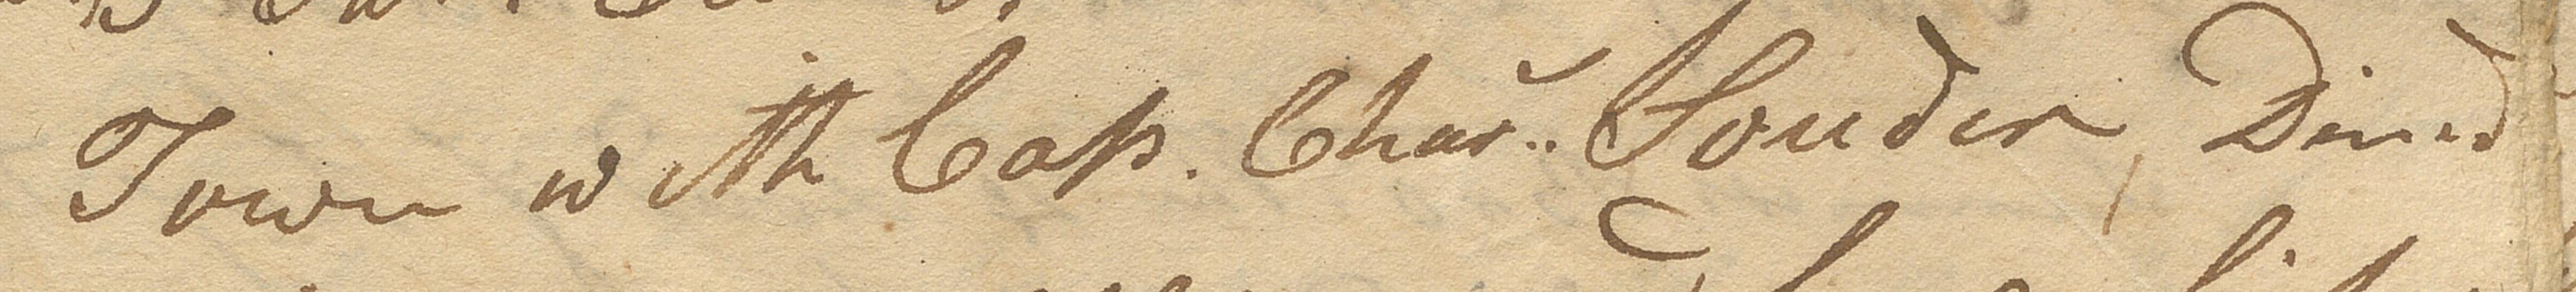Town with Cap. Char^s. Souder, Dined
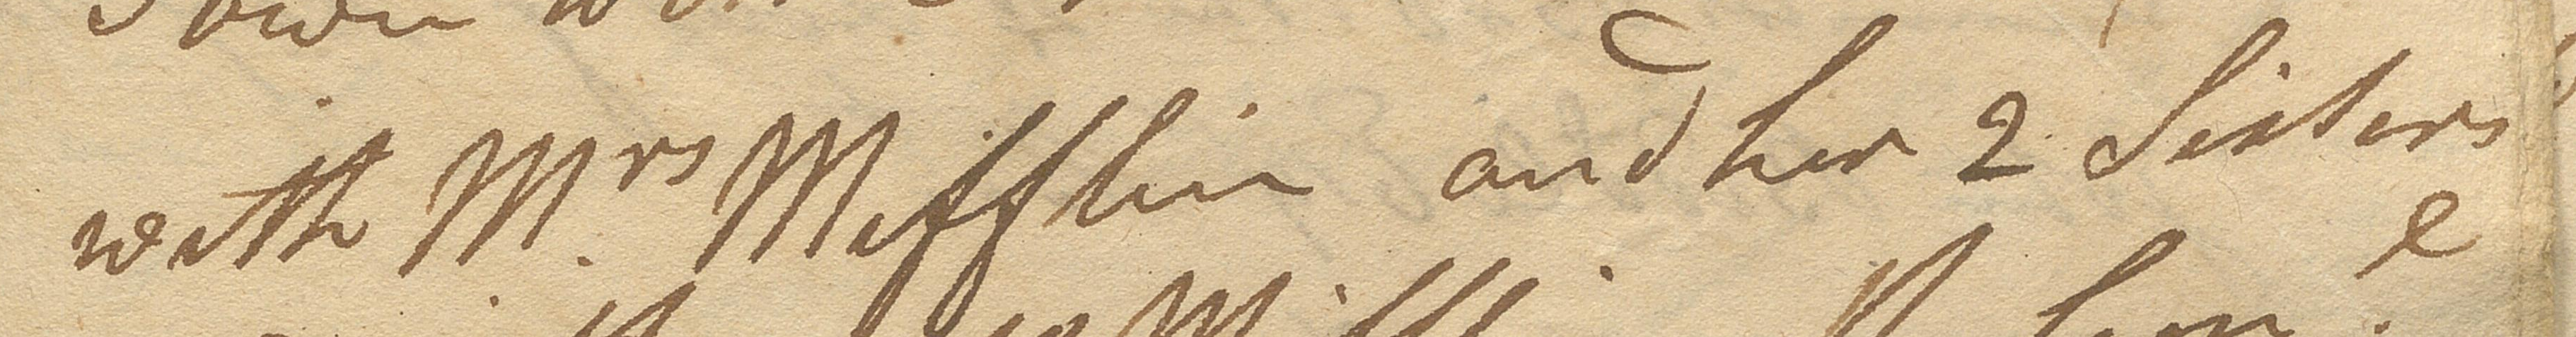with M^rs. Mifflin and her 2 Sisters
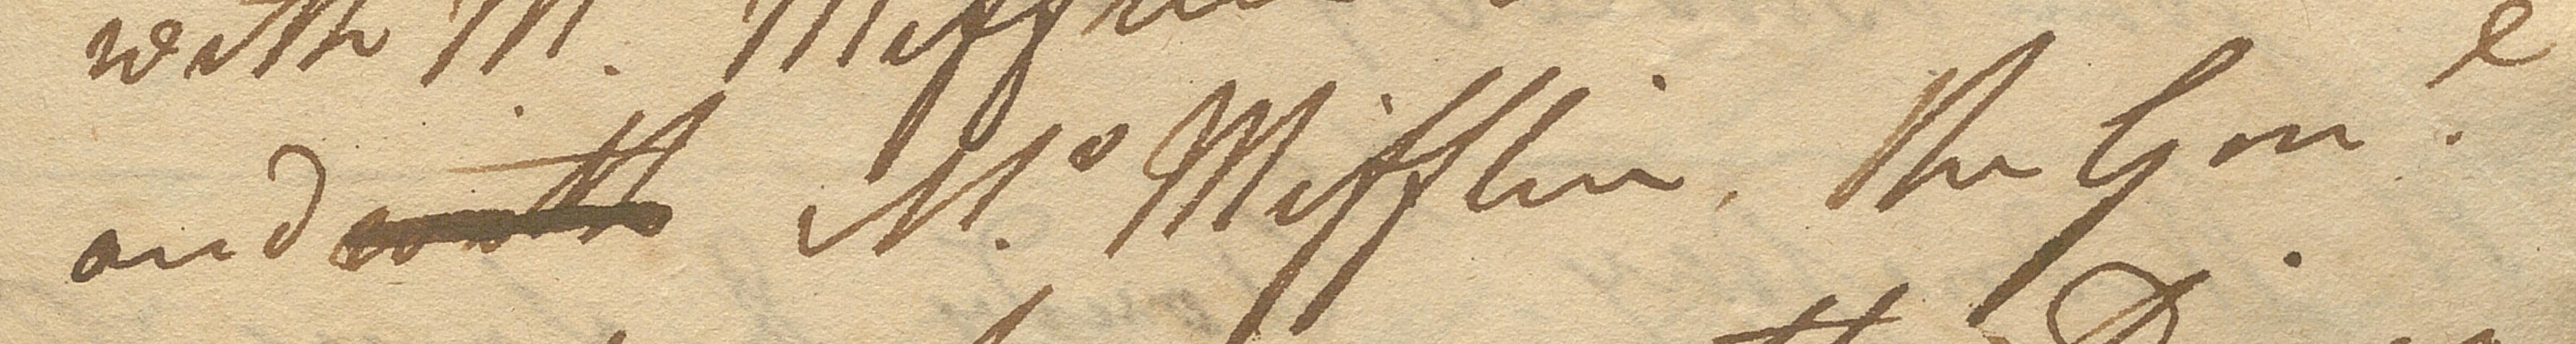and [with] M^r. Mifflin, the Gen^l.
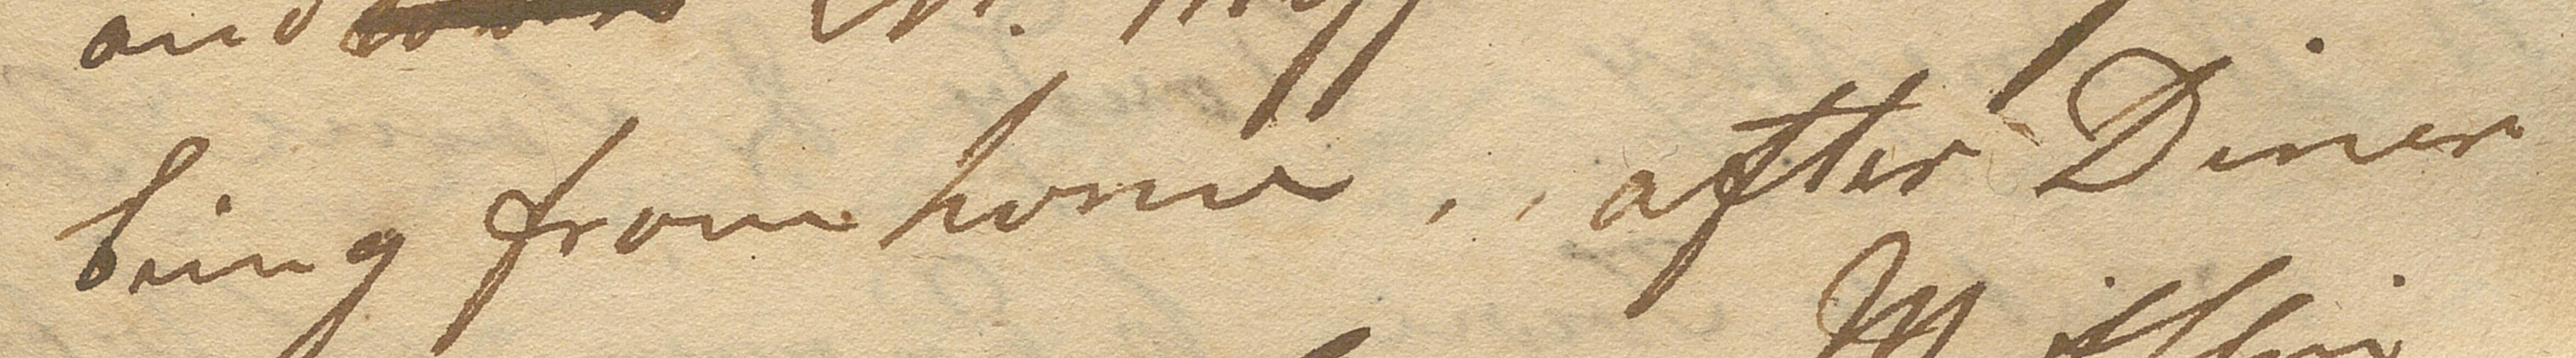being from home, after Diner
